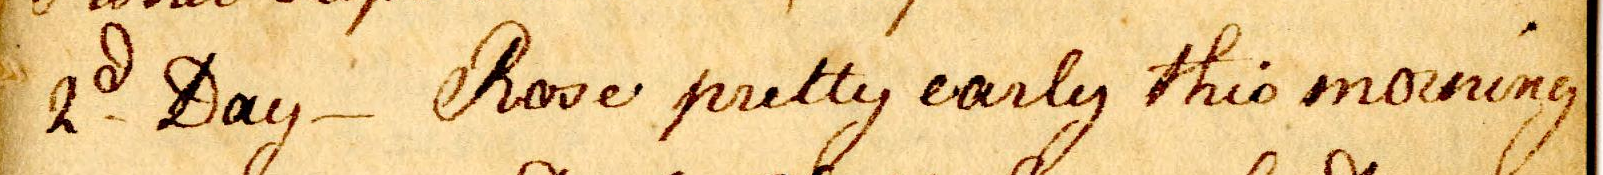2^d Day- Rose pretty early this morning
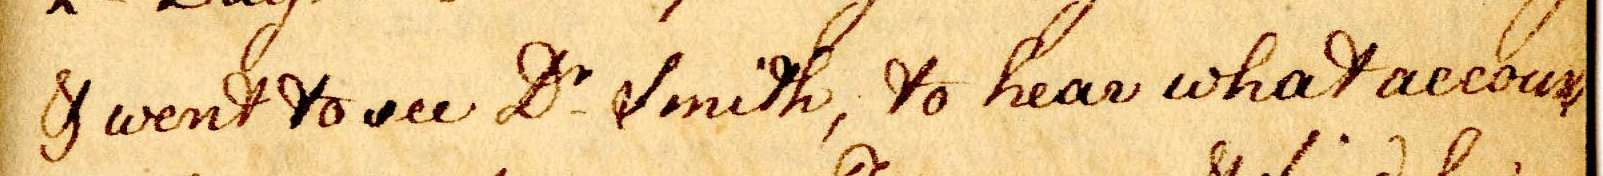& went to see D^r Smith, to hear what account
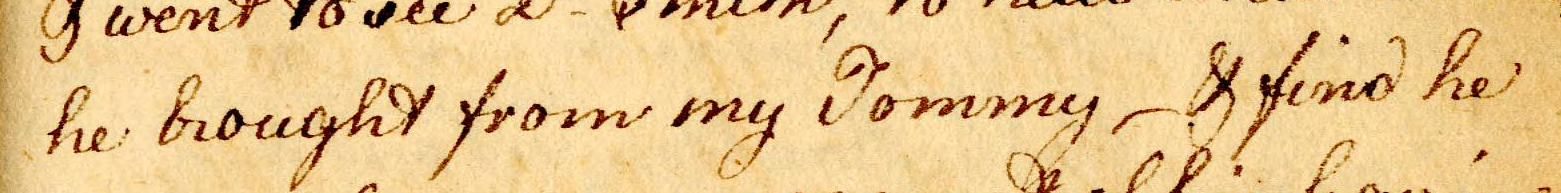he brought from my Tommy- & find he
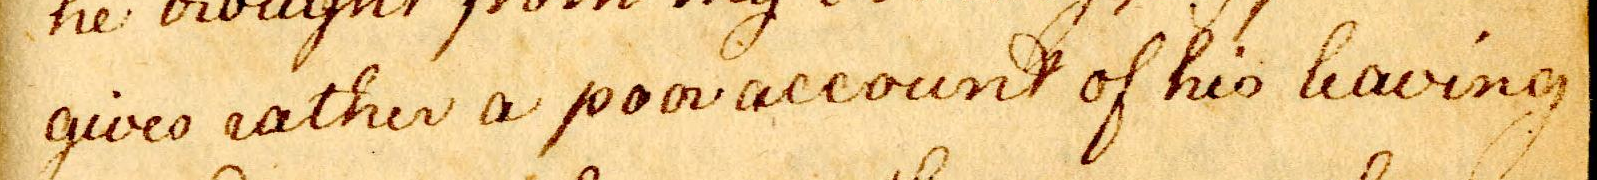gives rather a poor account of his leaving
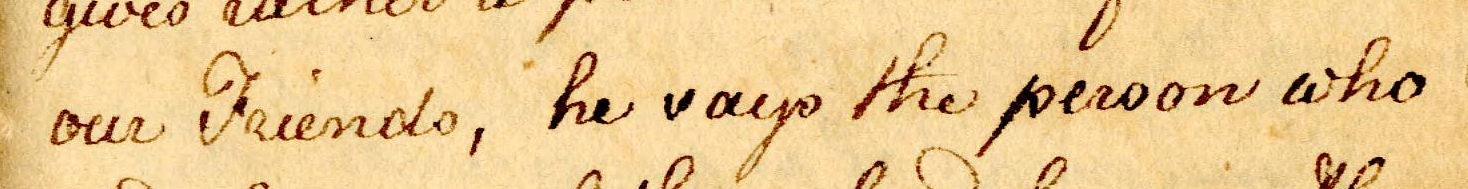our Friends, he says the person who
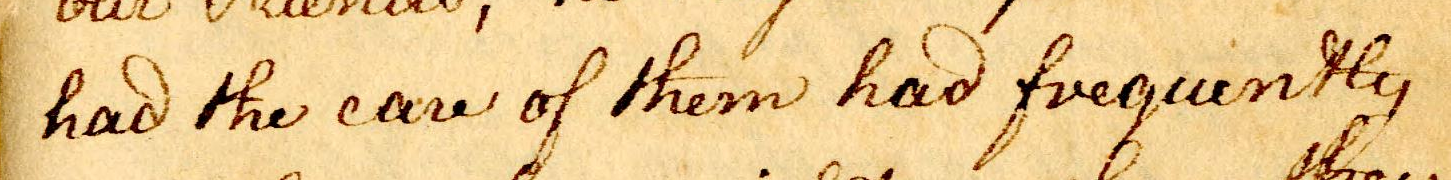had the care of them had frequently
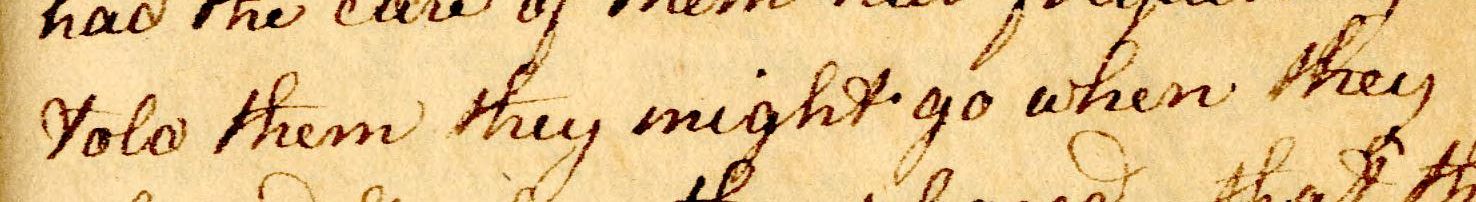told them they might go when they
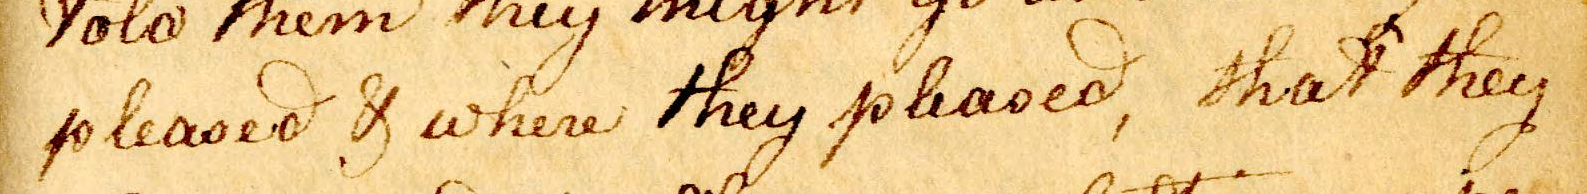pleased & where they pleased, that they
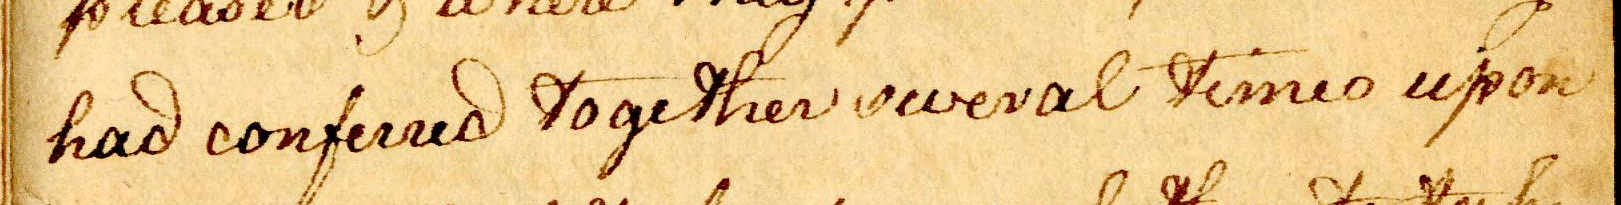had conferred together several times upon
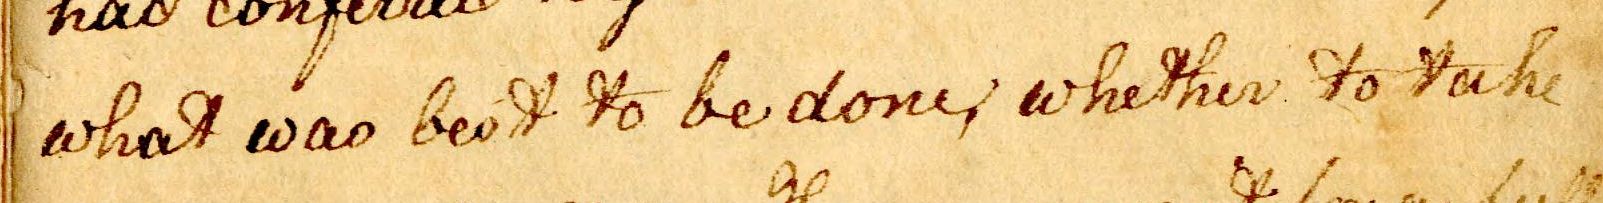what was best to be done, whether to take
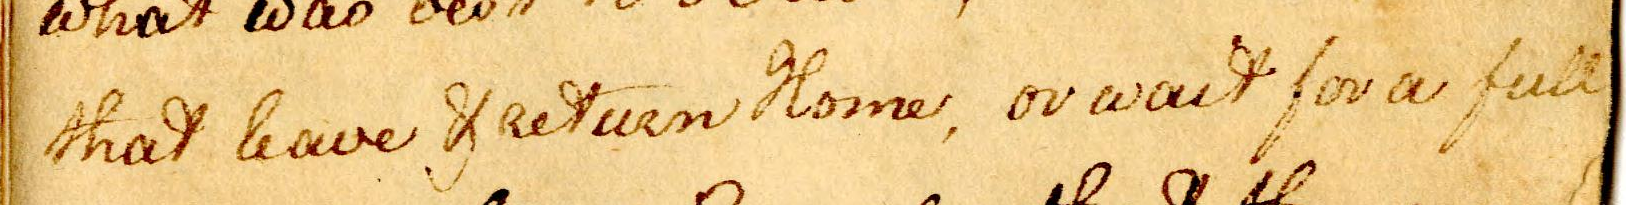that leave & return Home or wait for a full
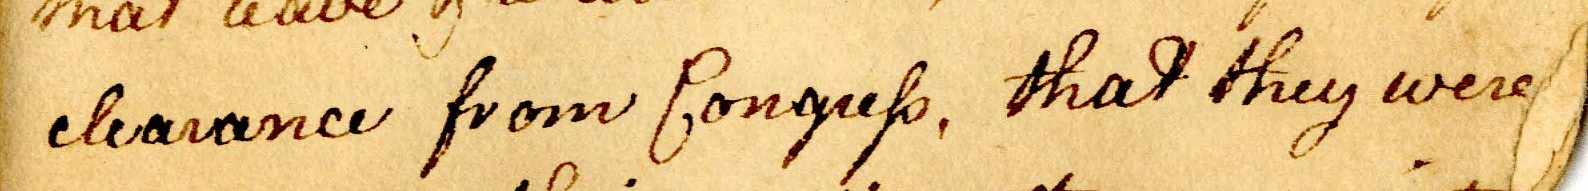clearance from Congress, that they were
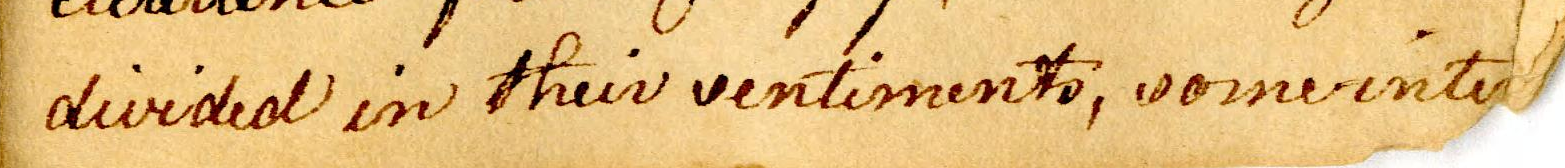divided in their sentiments, some inter
